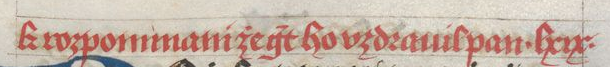krozpominani że gt ho uzdrauil pan lxix.
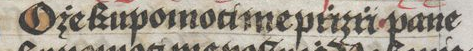Ože kupomoci me pṙizṙi.pane
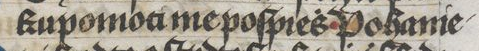kupamoci mepoſpieṡ.Pohanie¬
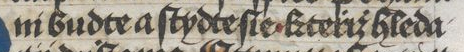ni budte a ſtydte ſie.kteṙiż hleda¬
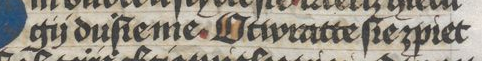gij duẛíe me.Otwratte ſie zpiet
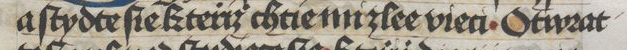a ſtydte ſie kteṙiż chtie mi zlee vieci.Otwrat¬
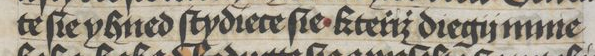te ſie yhned stydiece ſie.kteṙiż diegii mnie
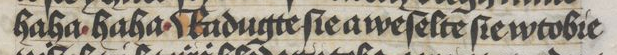haha.haha.Radugte ſie a weſelte ſie wtobie
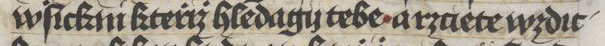vẛickni kteṙiž hledagí tebe.a rzciete wzdit¬
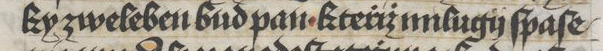ky zweleben bud pan.kteṙíż milugij ſpaſe¬
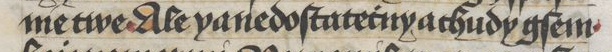nie twe.Ale ya nedoſtateċny a chudy gsem.
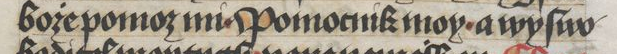boże pomoz mi.Pomocnik moy.a wyſwo¬
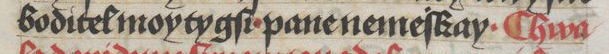boditel moy ty gſi.pane nemeẛkay.Chwa¬
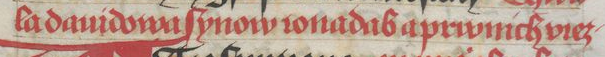la dauidowa ſynow ionadab a prwních viez¬
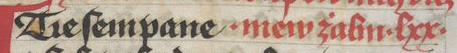Tie ſem pane .mew žalm.lxx.
